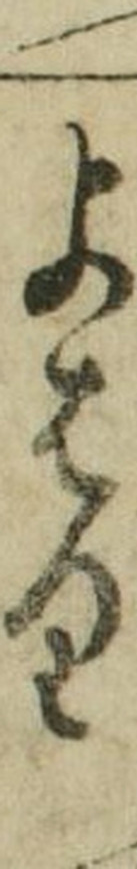よはり

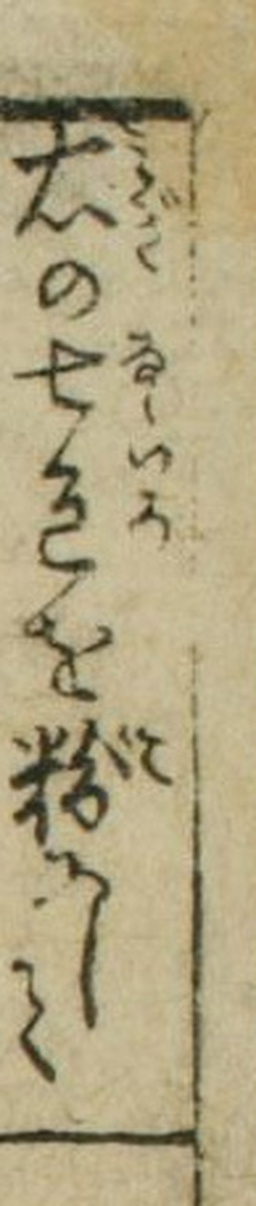右の七色を粉にして
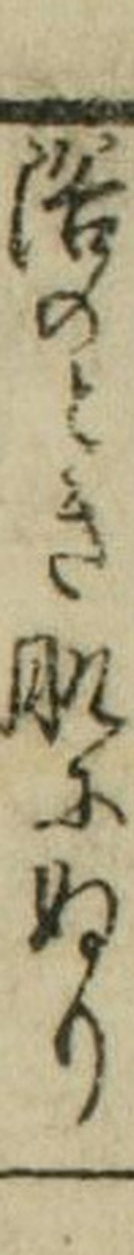浴のとき肌にぬり
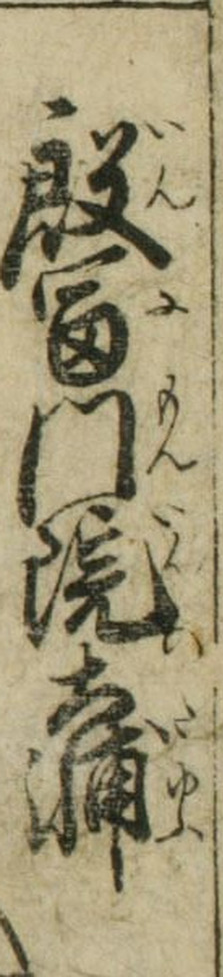殷富門院大輔
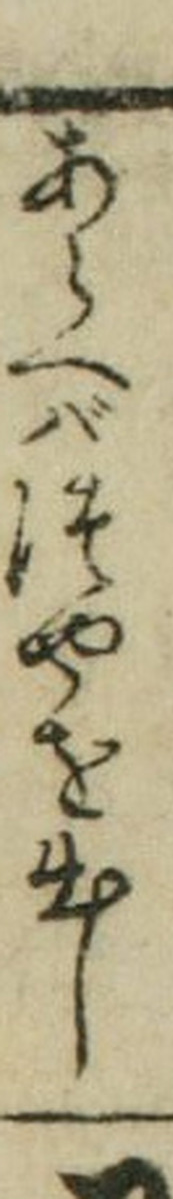あらへばつやを出し
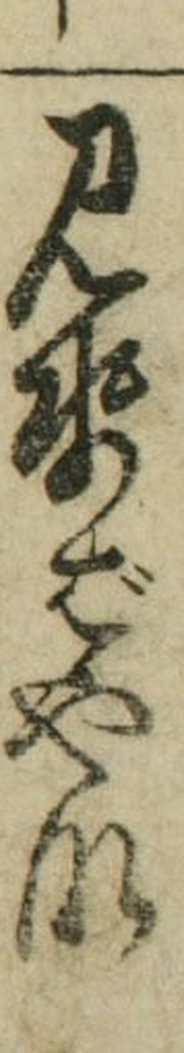見せばやな
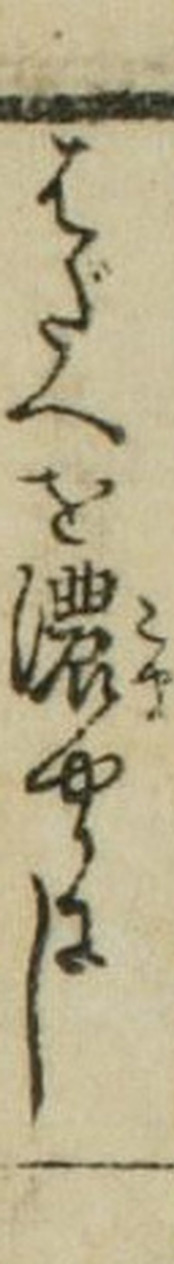はだへを濃やかにし
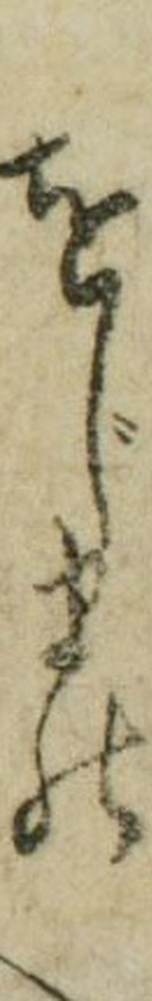をじまの
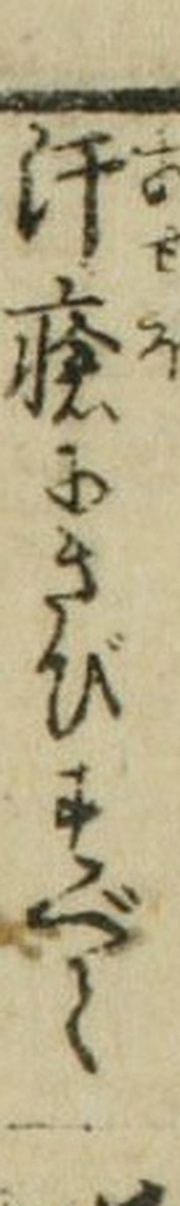汗瘡にきびすべて
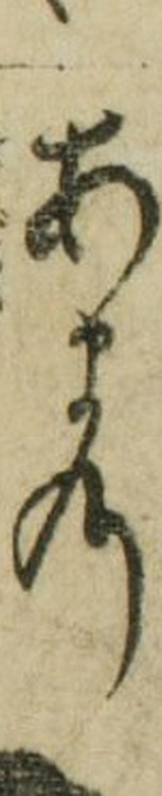あまの
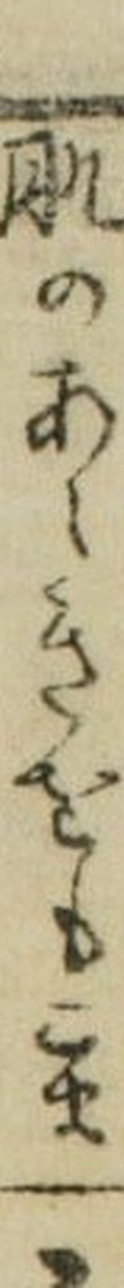肌のあしきをもこま
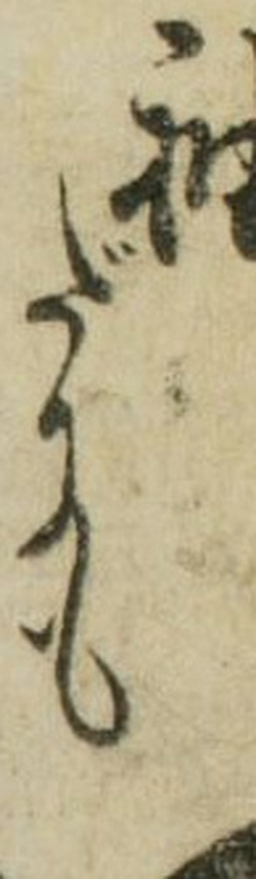だにも
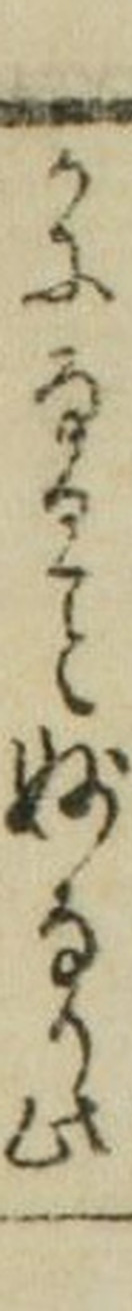かになること妙なり此
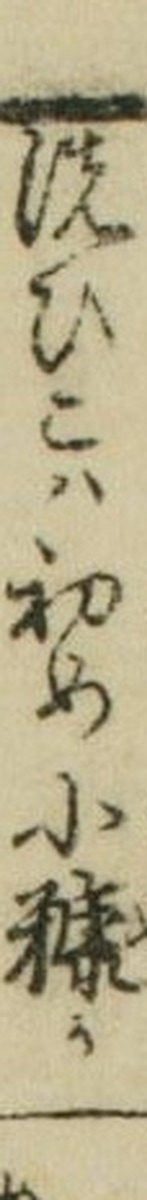洗ひこは初め小糠か
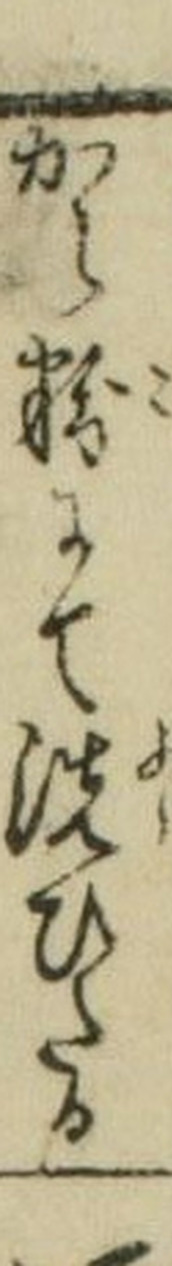から粉にて洗ひたる
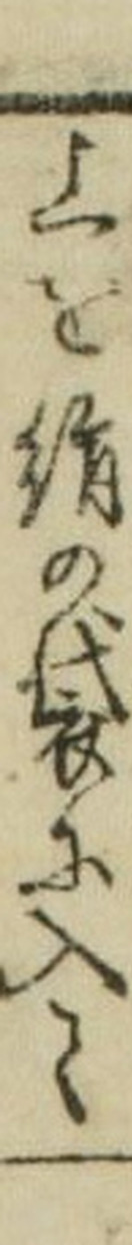上を絹の袋に入て
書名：百人一首
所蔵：東京学芸大学教育コンテンツアーカイブ
